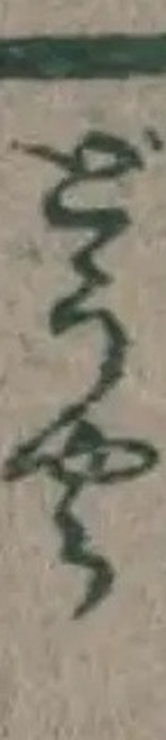どうやら
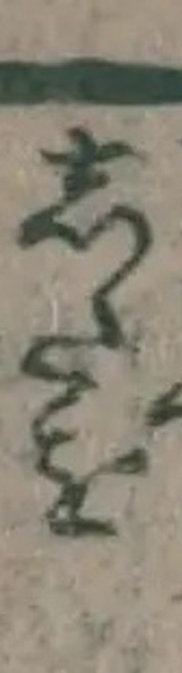したを
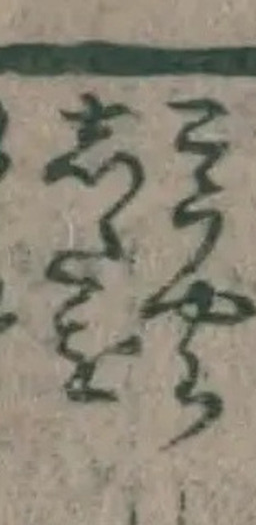したを
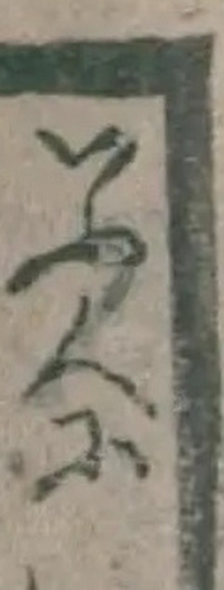いふ人に
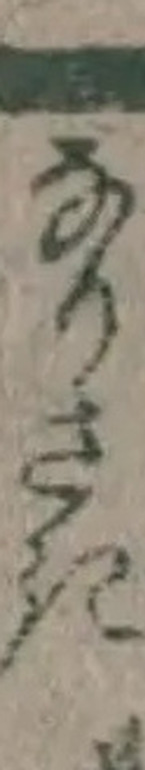なりさき
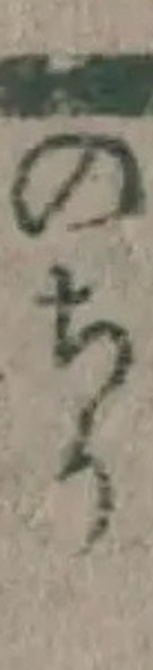のちう
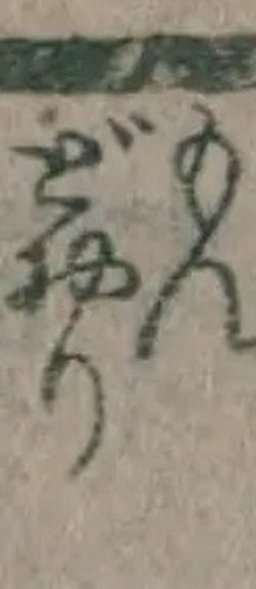どおり
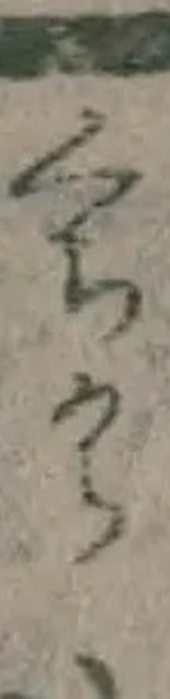くちから
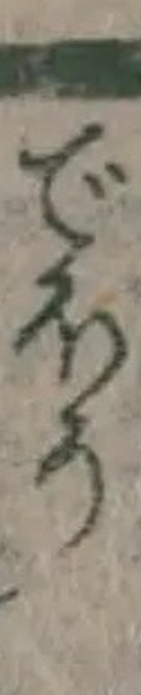でほう
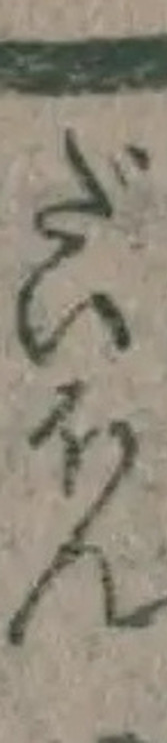だいほん
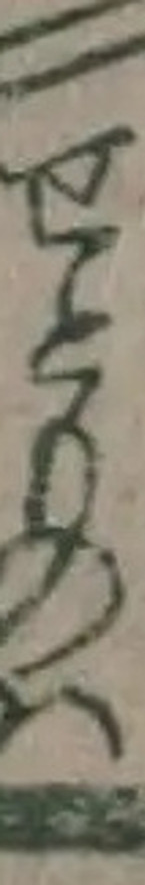せとものは
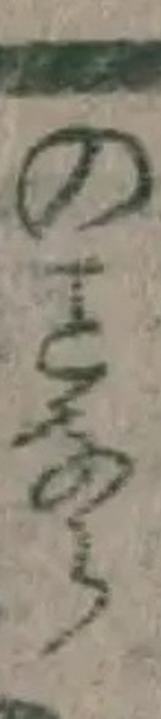のことなら
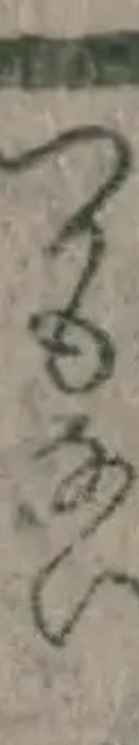つりもない
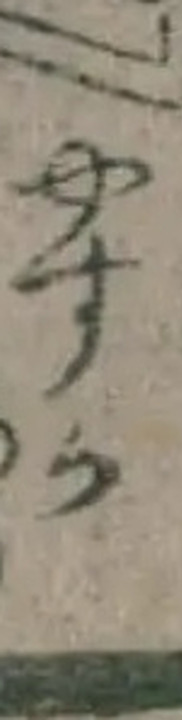やすか
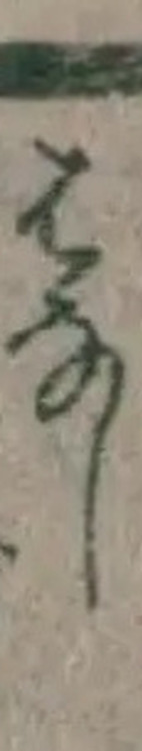はなし
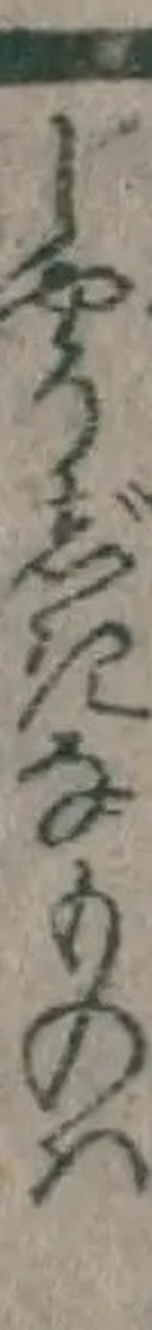しやうじきなものは
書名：縦筒放唐の噺 3巻
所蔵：国立国会図書館 National Diet Library, JAPAN
